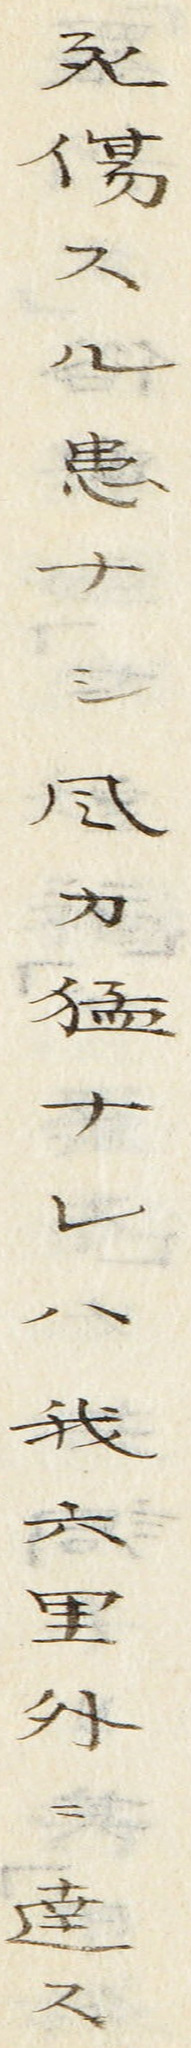死傷スル患ナシ風カ猛ナレハ我六里外ニ達ス
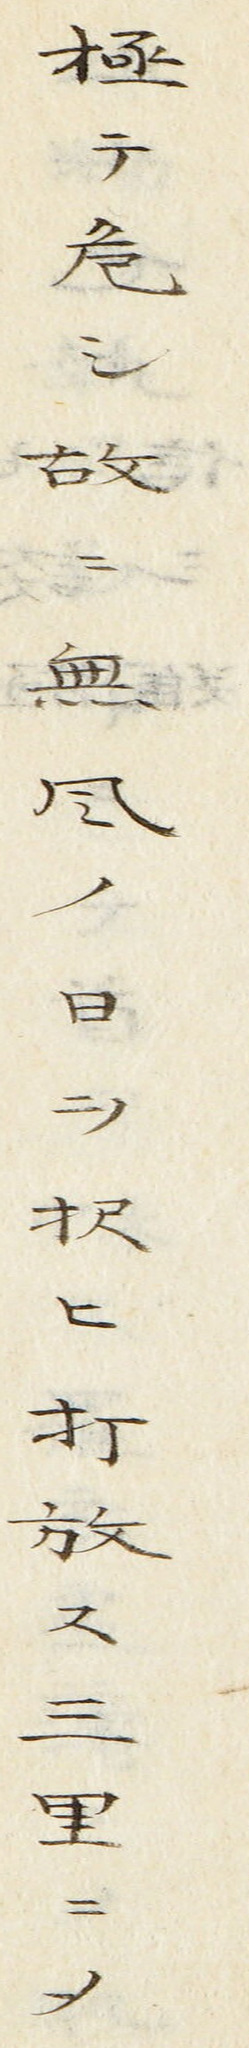極テ危シ故ニ無風ノ日ヲ択ヒ打放ス三里ニシテ

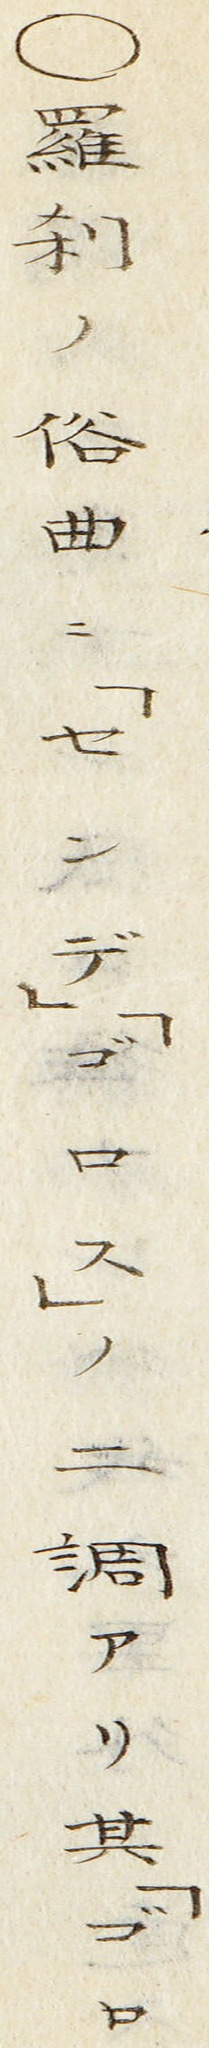〇羅刹ノ俗曲ニ「センデ」「ゴロス」ノ二調アリ其「ゴロ
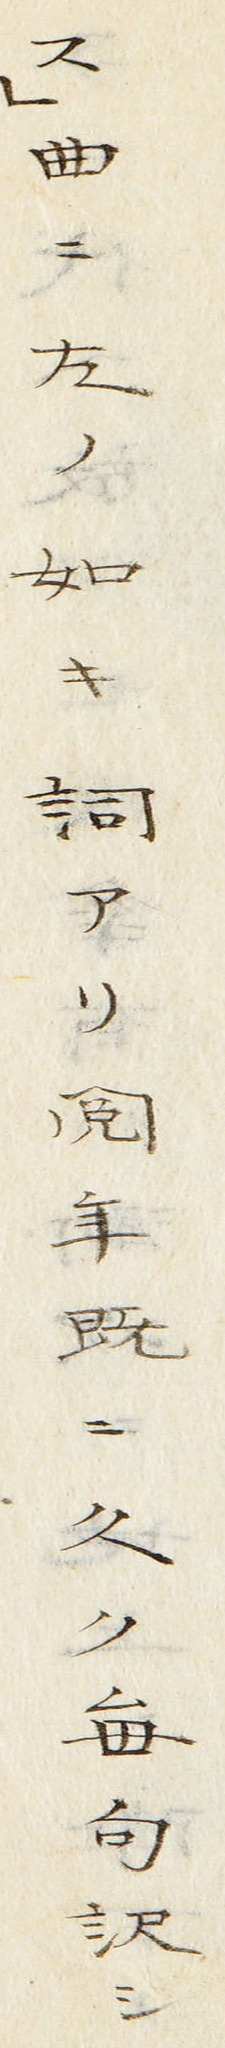ス」曲ニ左ノ如キ詞アリ閲年既ニ久ク毎句訳シ
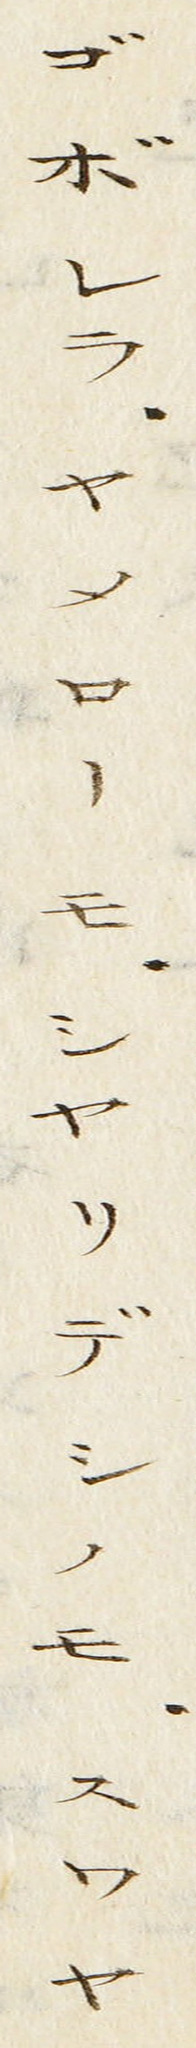ゴボレラ．ヤメローモ．シヤリデシノモ．スワヤ
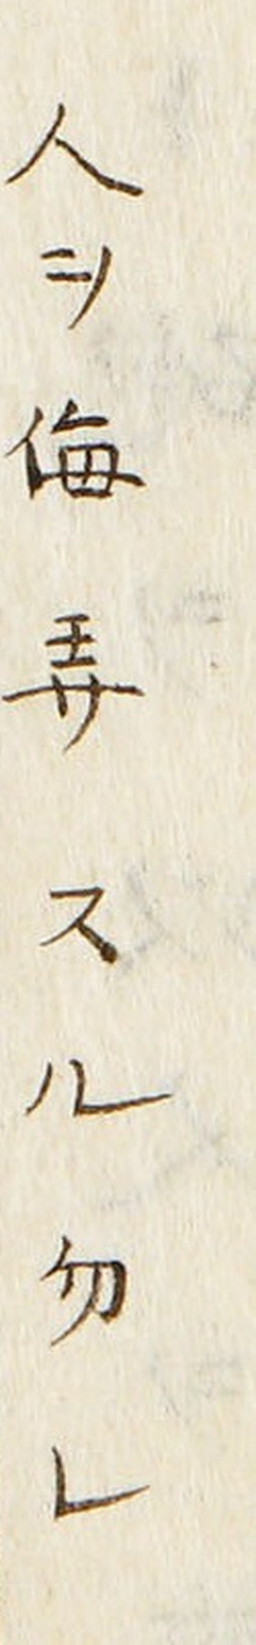人ヲ侮弄スル勿レ
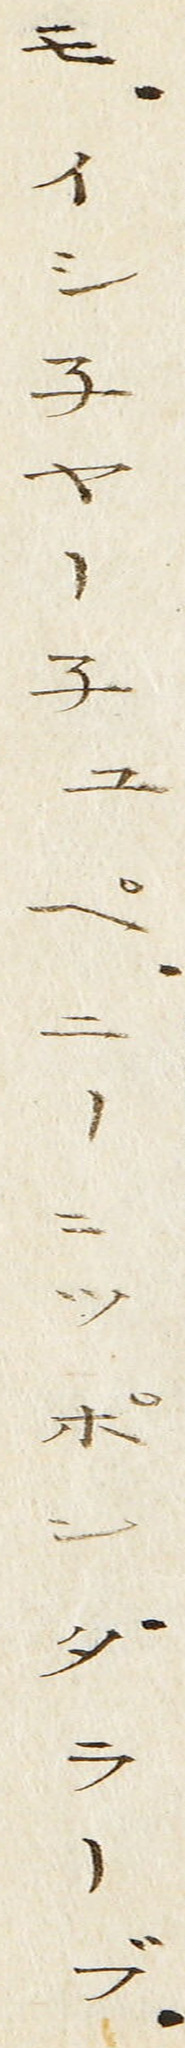モ．イシネヤーネユペ．ニーニツボダラーブ．
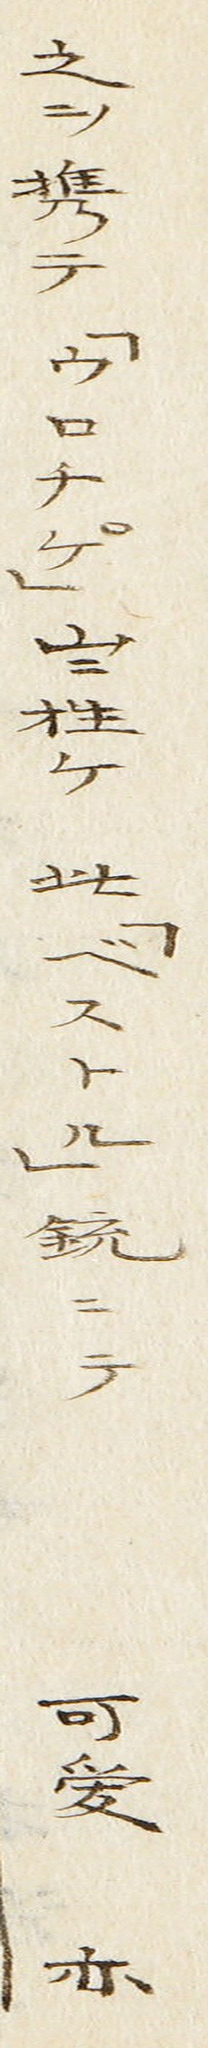之ヲ携テ「ウロチゲ」亗ケ此「ベストル」銃ニテ可愛亦
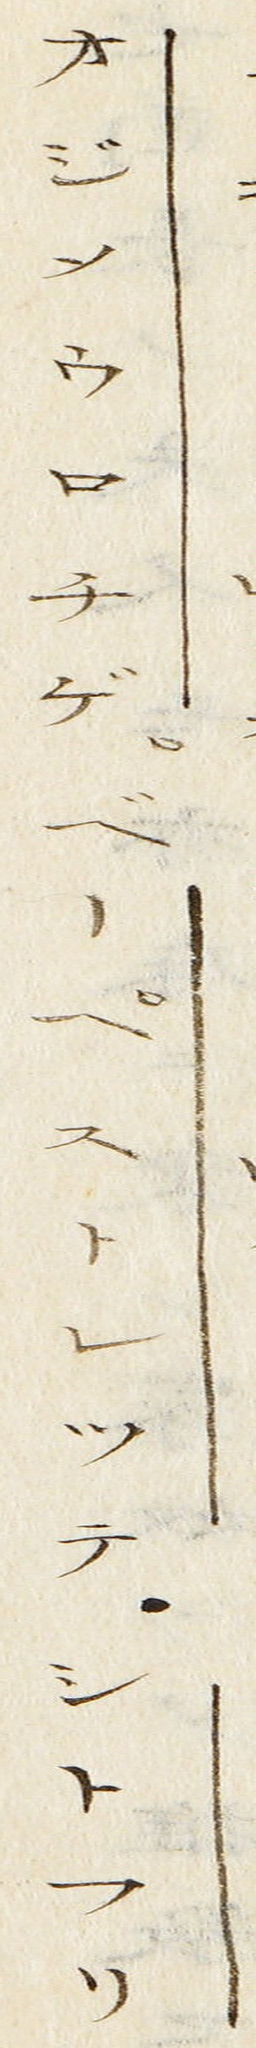オジメウロチゲ。ベーペストレツテ．シトフリ
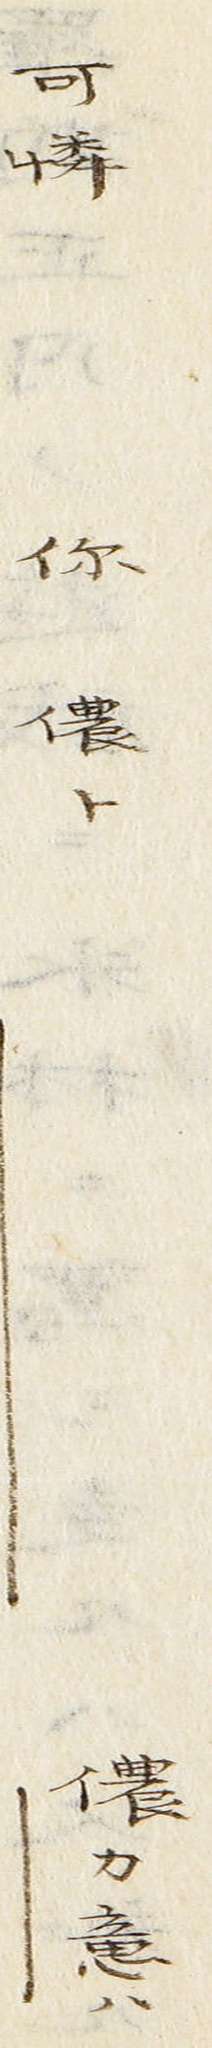可憐你儂ト儂カ意ハ
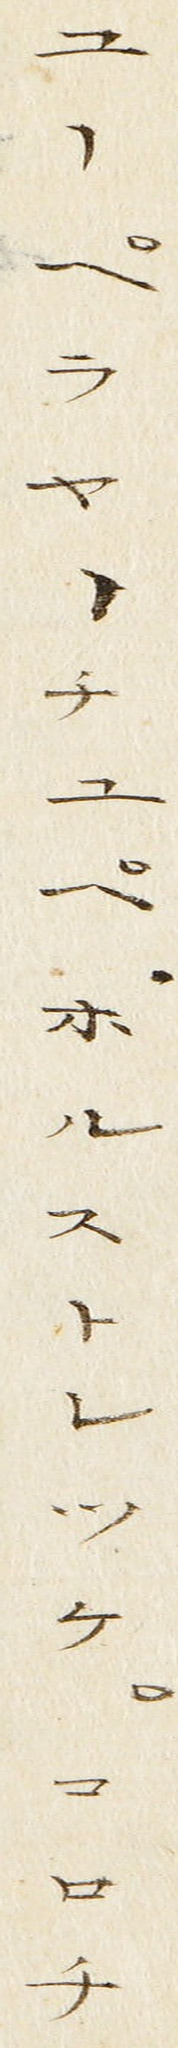ユーペラヤーチユペ．ホルストレツケ。コロチ
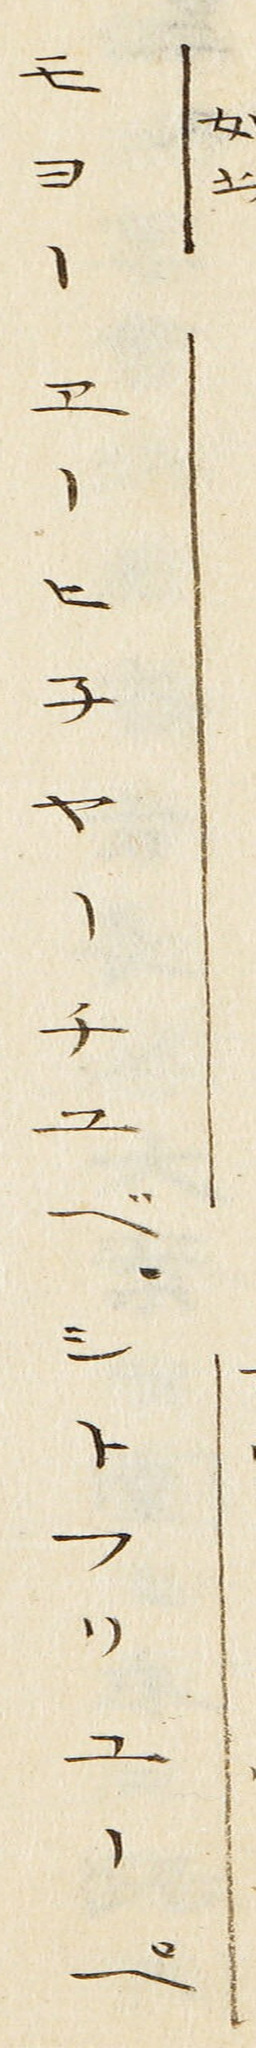モヨーヱーヒネヤーチユベ．シトフリユーペ
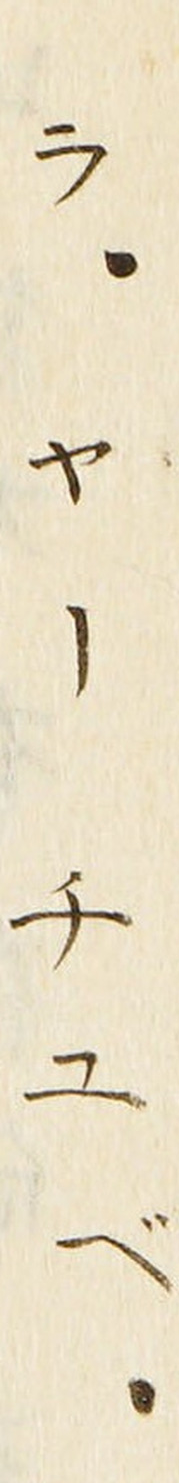ラ．ヤーチユベ．
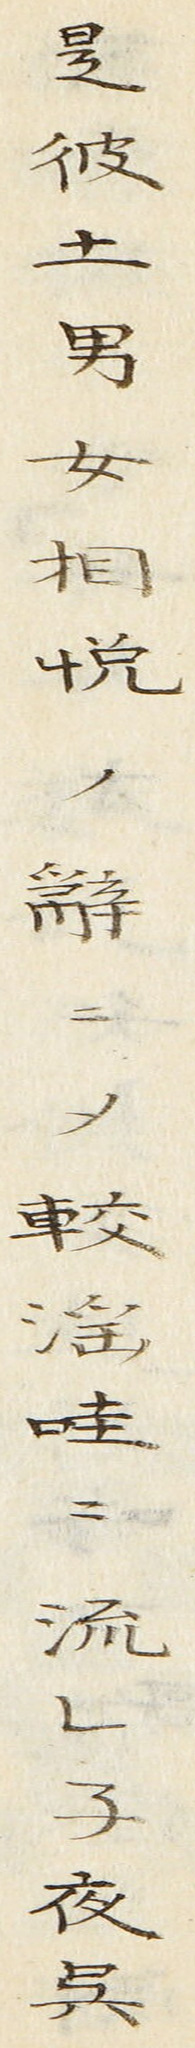是彼土男女相悦ノ辞ニシテ較滛哇ニ流レネ夜呉
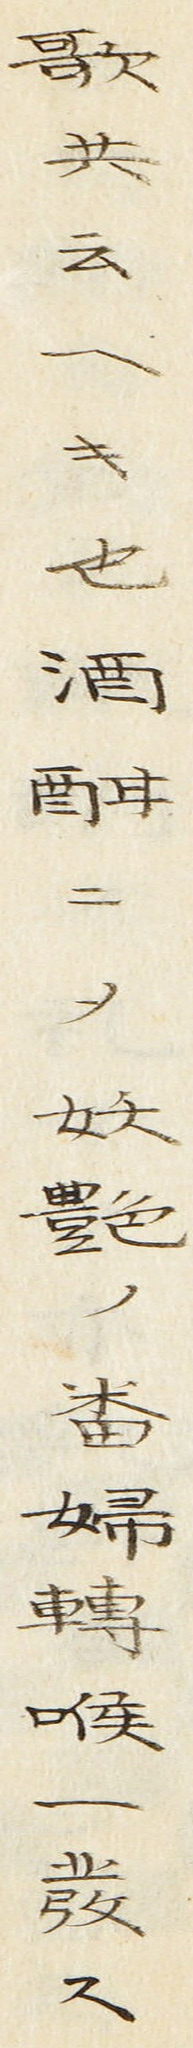歌共云ヘキ也酒酣ニシテ妖艶ノ番婦転喉一発ス
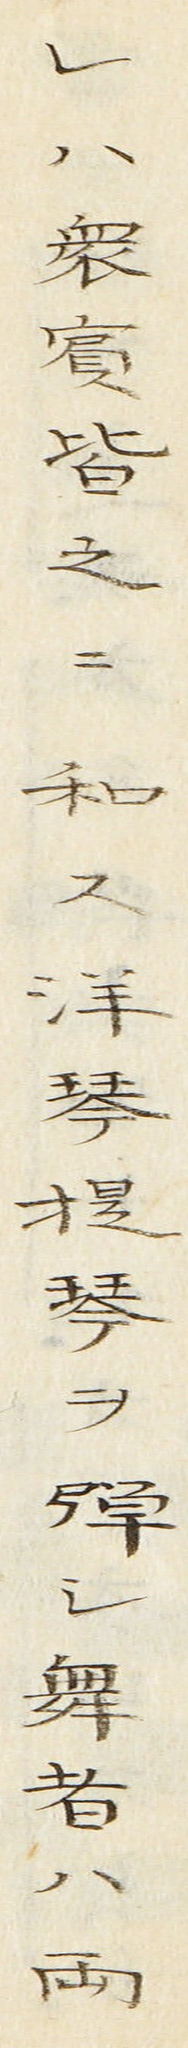レハ衆賓皆之ニ和ス洋琴提琴ヲ弾シ舞者ハ両
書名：蕃談
